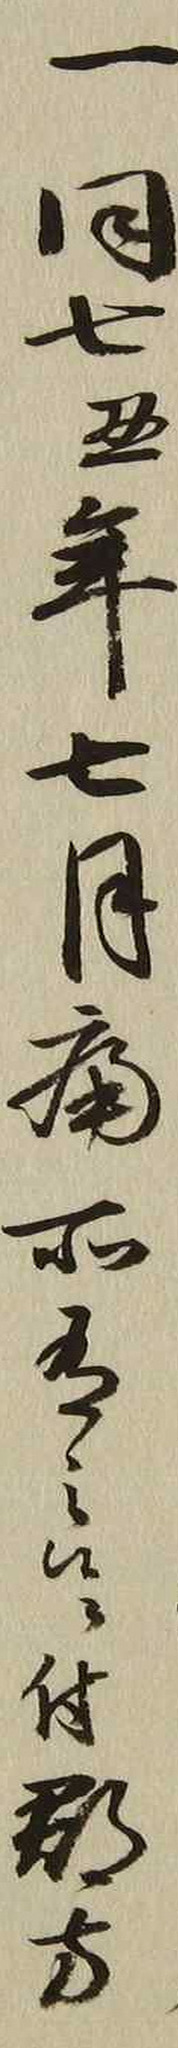一同七丑年七月痛所有之候ニ付郡方
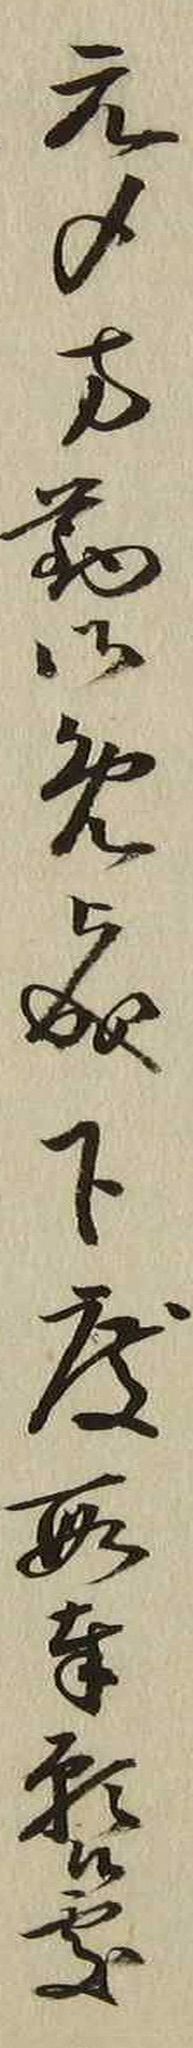元〆方勤御免被成下度段奉願候処
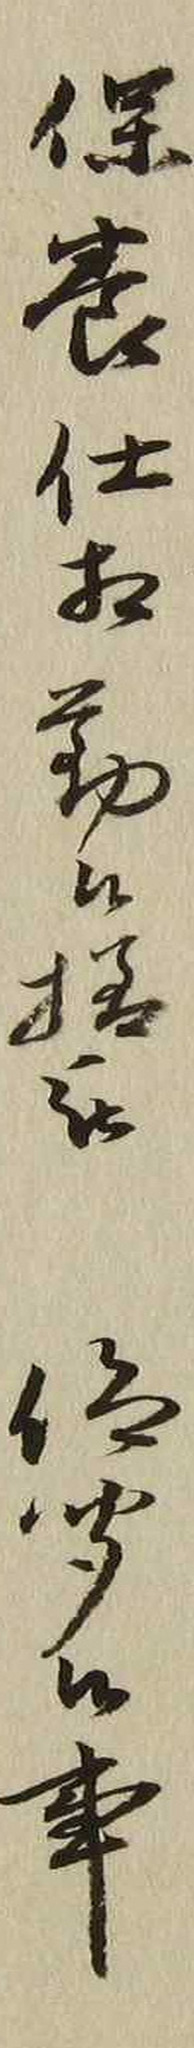保養仕相勤候様被仰聞候事
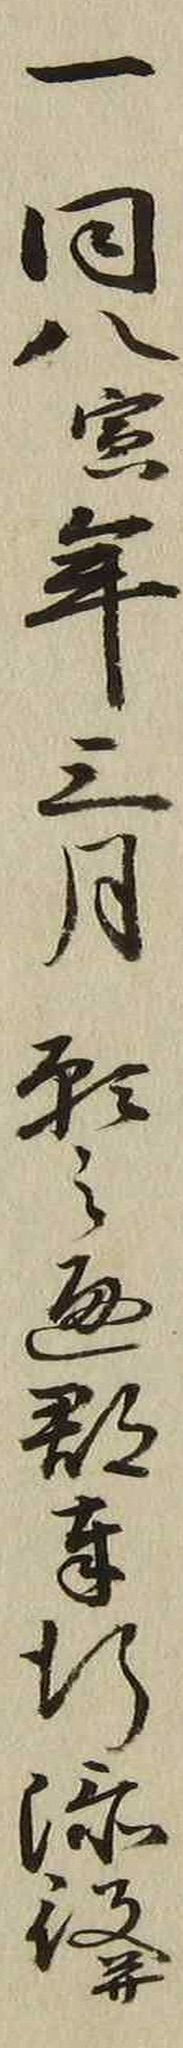一同八寅年三月願之通郡奉行添役幷
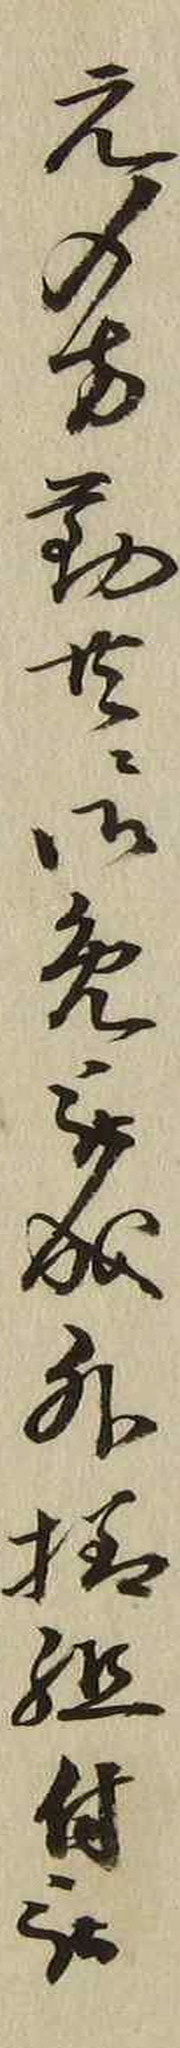元〆方勤共ニ御免被成外様組付被
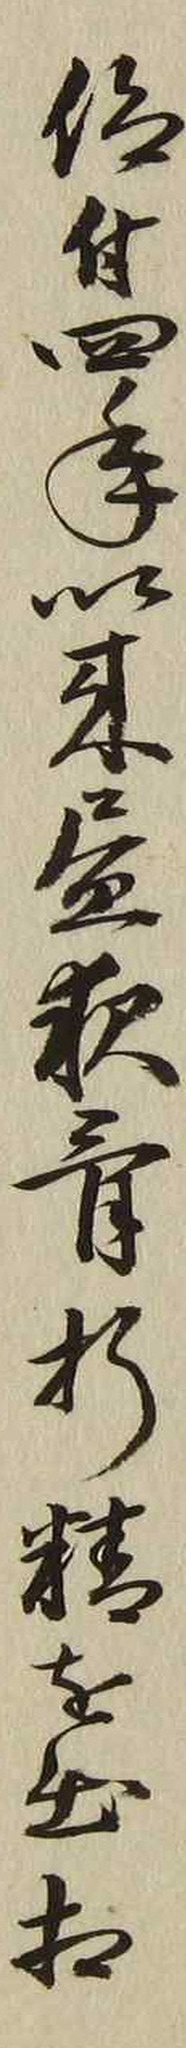仰付四年以来昼夜骨折精を出相
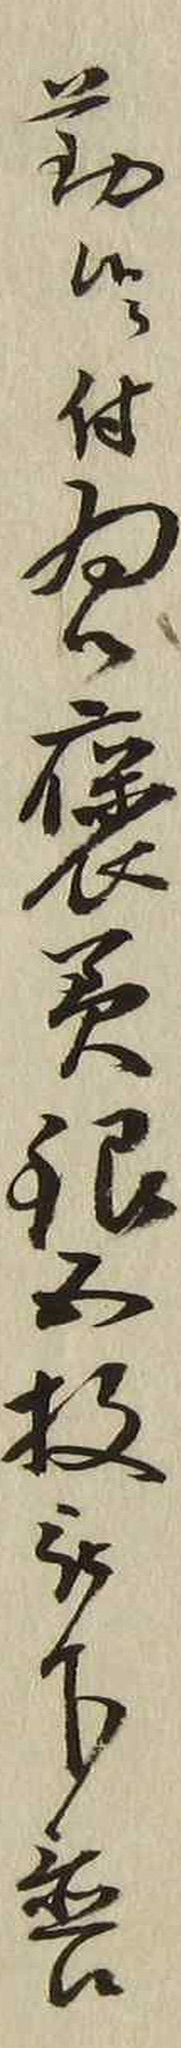勤候ニ付為御褒美銀五枚被下置候
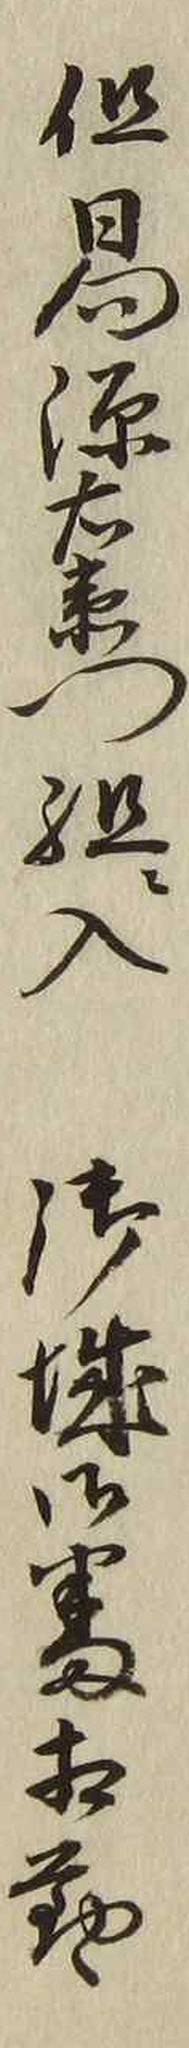但日向源右衛門組ニ入御城御番相勤候

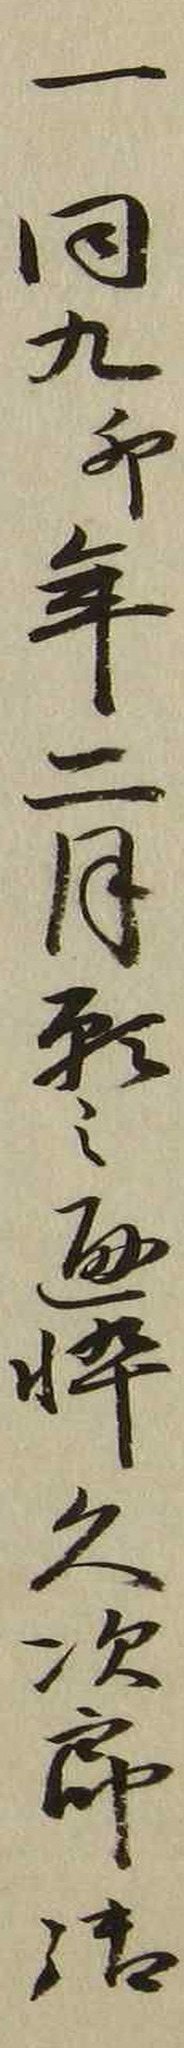一同九卯年二月願之通忰久次郎御
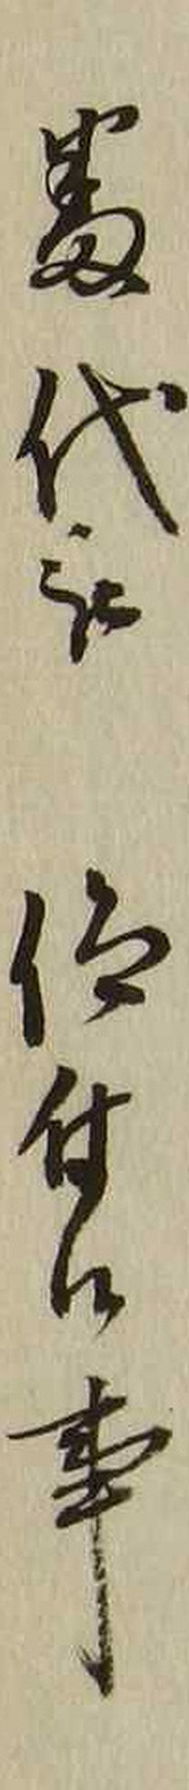番代被仰付候事
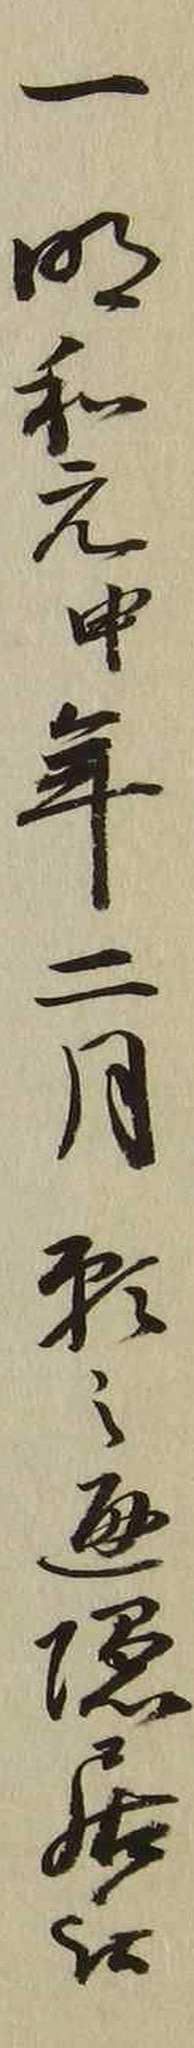一明和元申年二月願之通隠居被
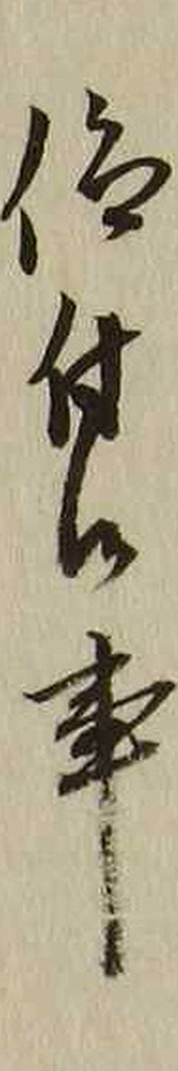仰付候事
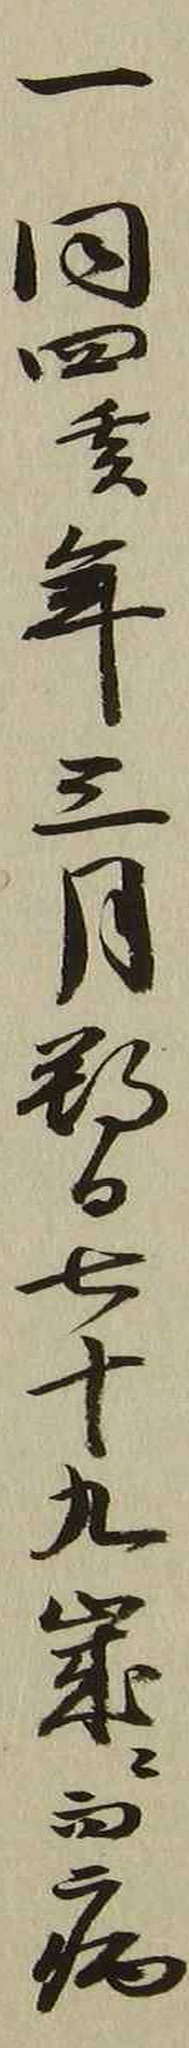一同四亥年三月朔日七十九歳ニ而病
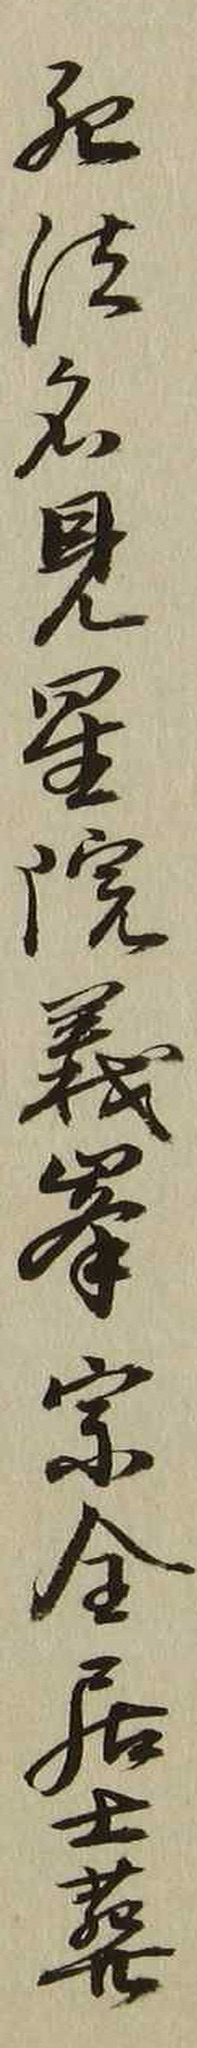死法名見星院義峯宗全居士葬
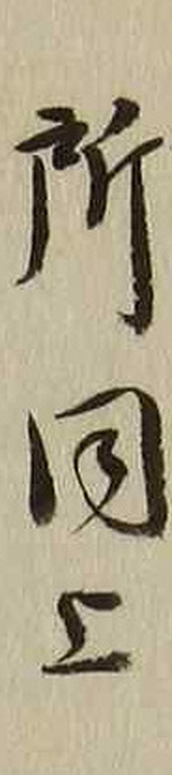所同上
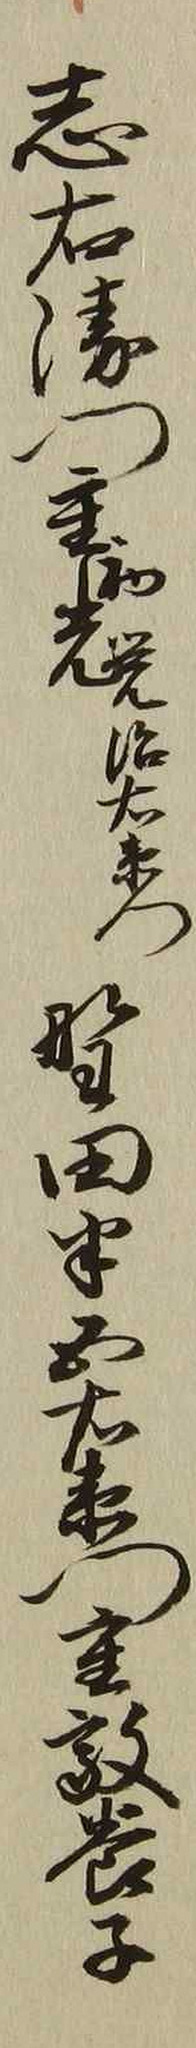志右衛門重光初覚治右衛門野田五右衛門重敦養子
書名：諸士系譜　巻之61　と之部4
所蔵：会津若松市立会津図書館
